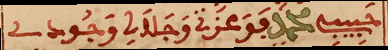حبيبي محمد فوعزتى و جلالي وجودي
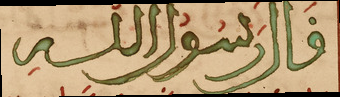قال رسول الله
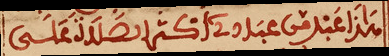هذا عبد من عبادى اكثر الصلاة على
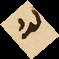له
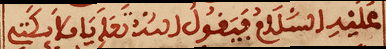عليه السلام فيقول الله تعلى يا ملائكتي
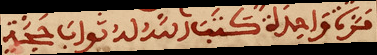مرة واحدة كتب الله له ثواب حجة
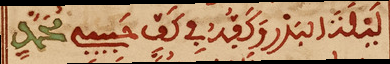ليلة البدر و كفه في كف حبيبي محمد
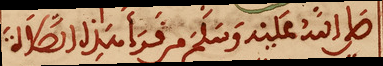صلى الله عليه و سلم من قرأ هذه الصلاة
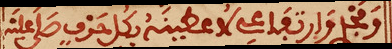و مجدي وارتفاعي لاعطينه بكل حرف صلى عليه
